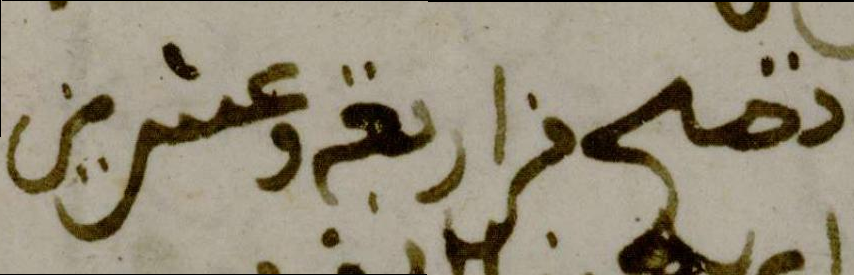تصح من اربعة عشرين
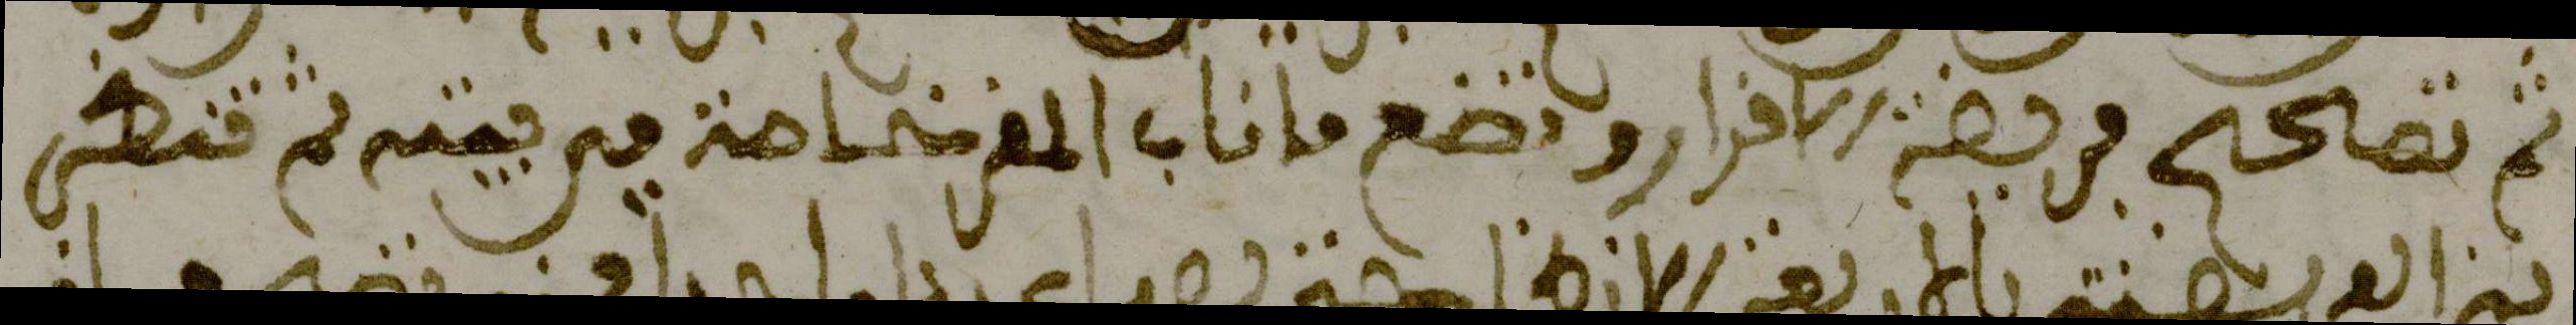ثم تصحح فريضة الاقرار وتضع ما ناب لمقر خاصة في بيته ثم تنظر
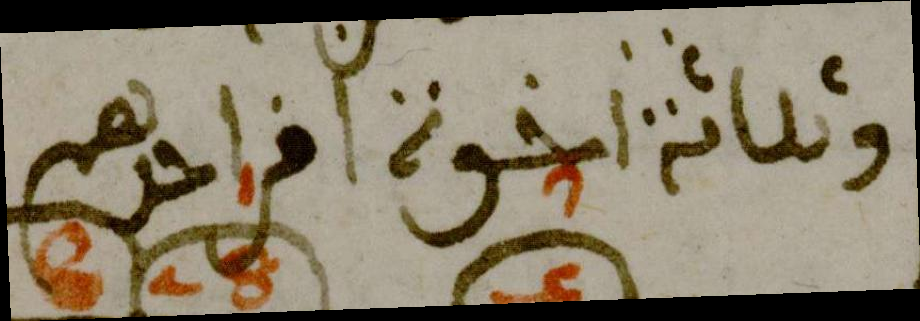وثلاثة اخوة اقر احدهم
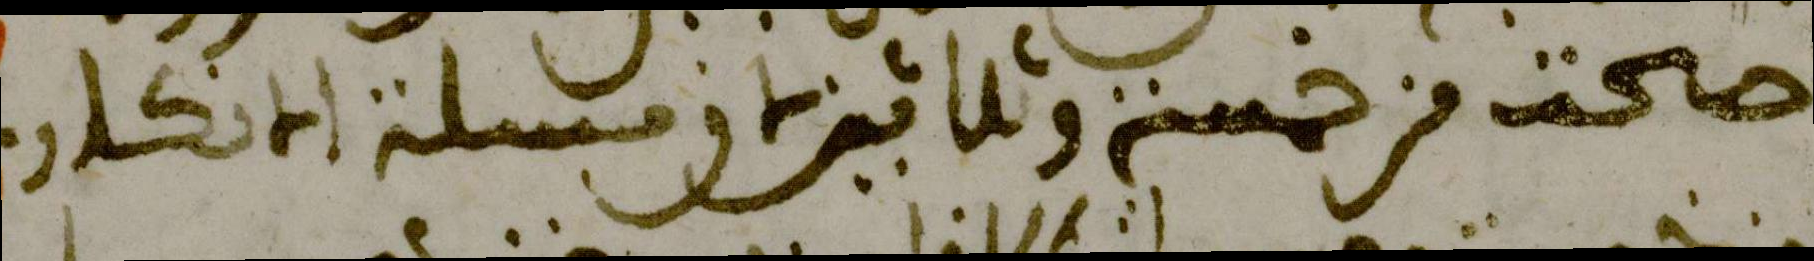صحت من خمسة وثلاثين لان مسلة الانكار
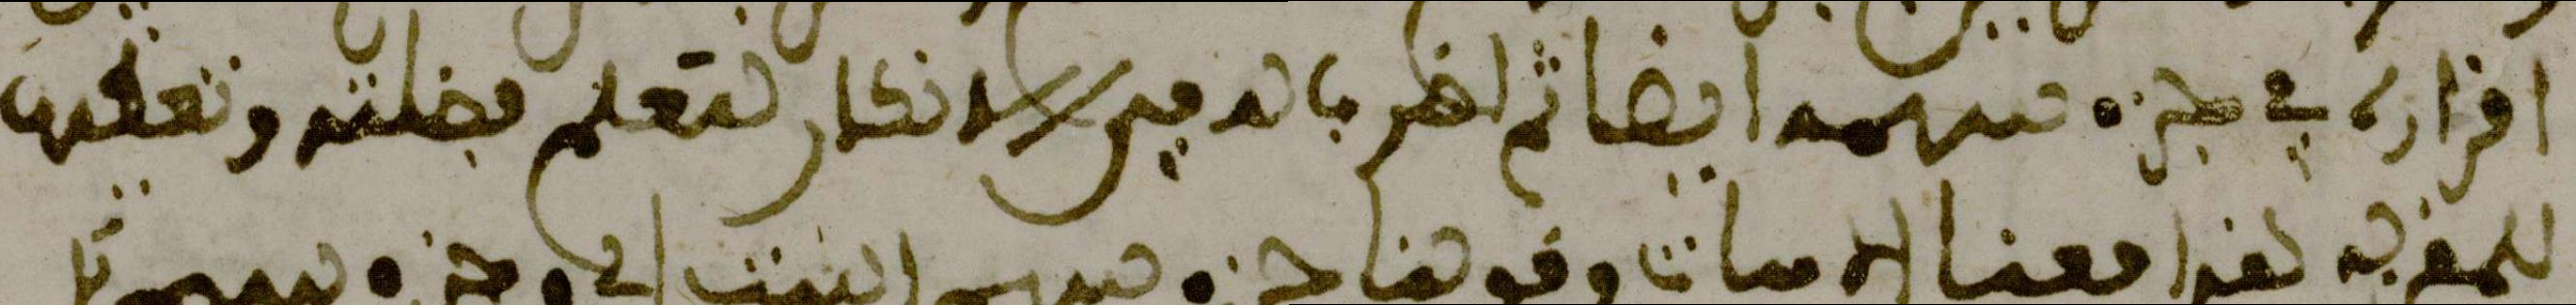اقراره في جزء سهمه ايضا ثم اضرب له في الانكار لتعلم فضلته وتعظيها
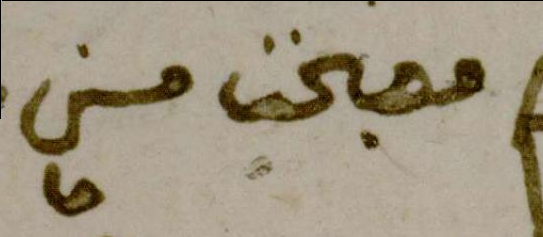فصحت من
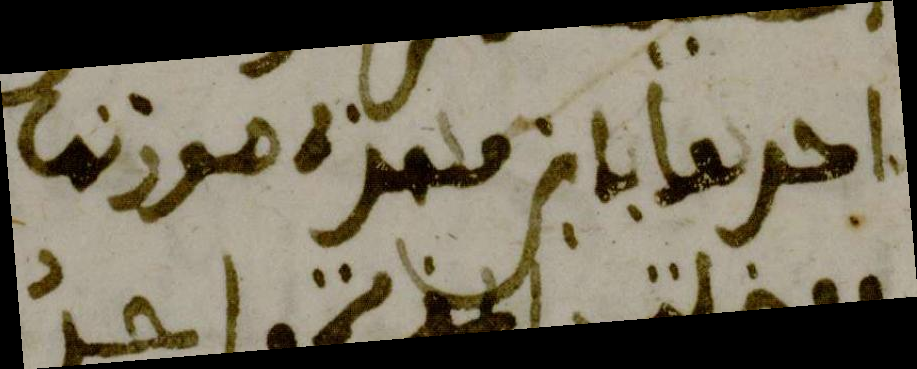احدهما بابن فهذه صورتها
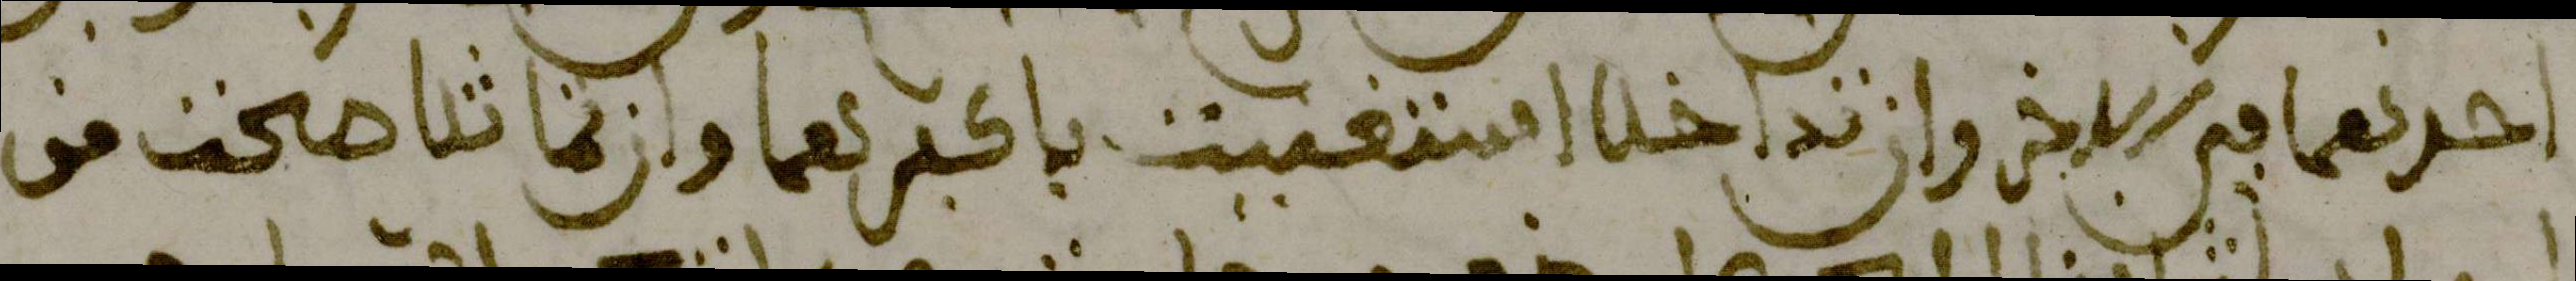احدهما في الاخر وان تداخلا استغنيت باكبرها وان تما ثلا صحت من
